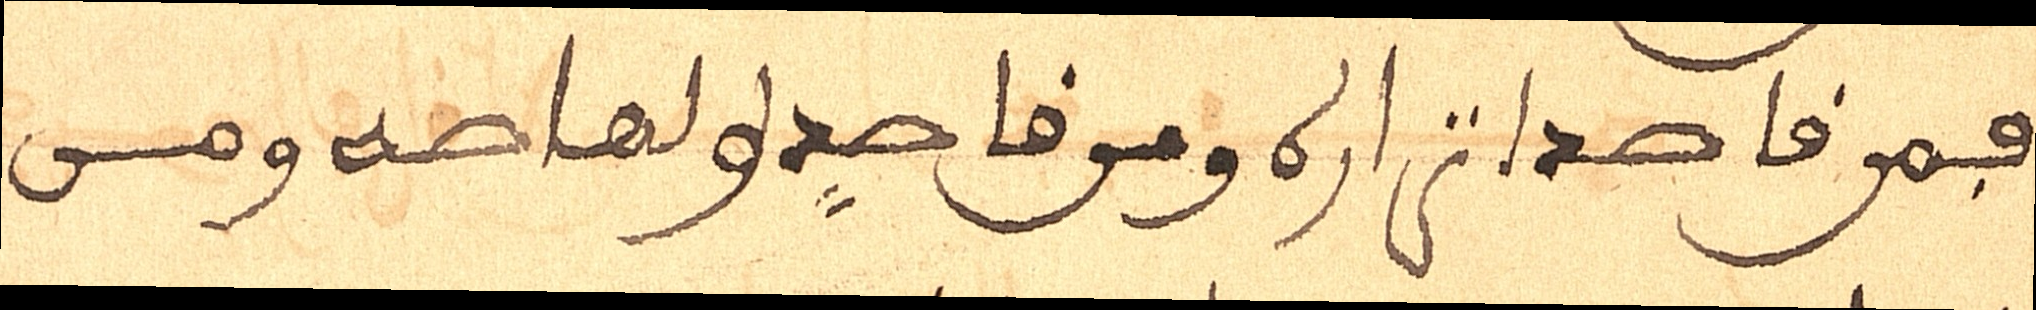فمن قاصد اتراره ومن قاصد لو لهاصه ومن
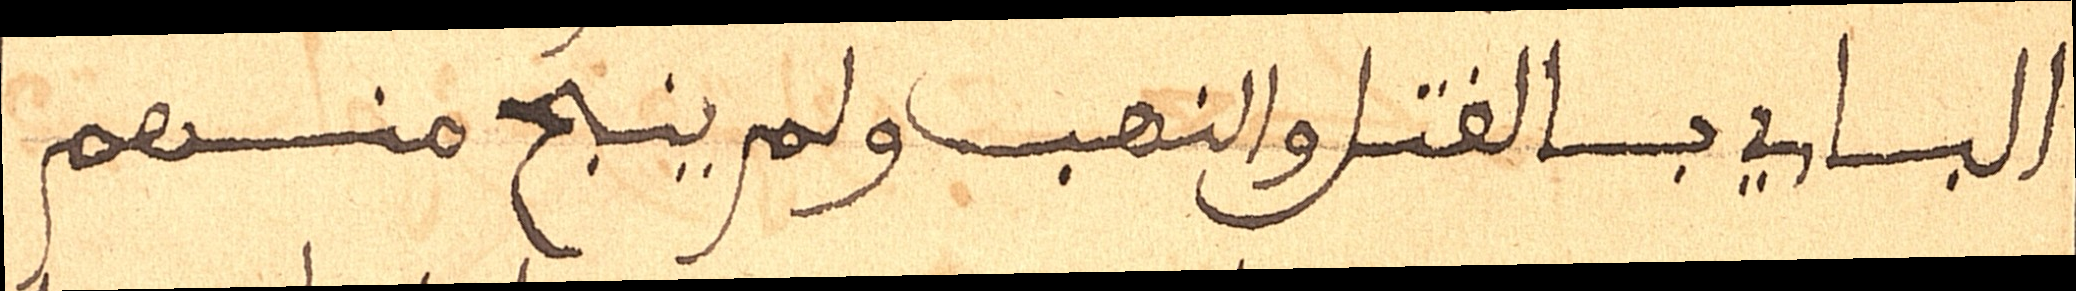الباي بالقتل والنهب ولم ينبح منهم
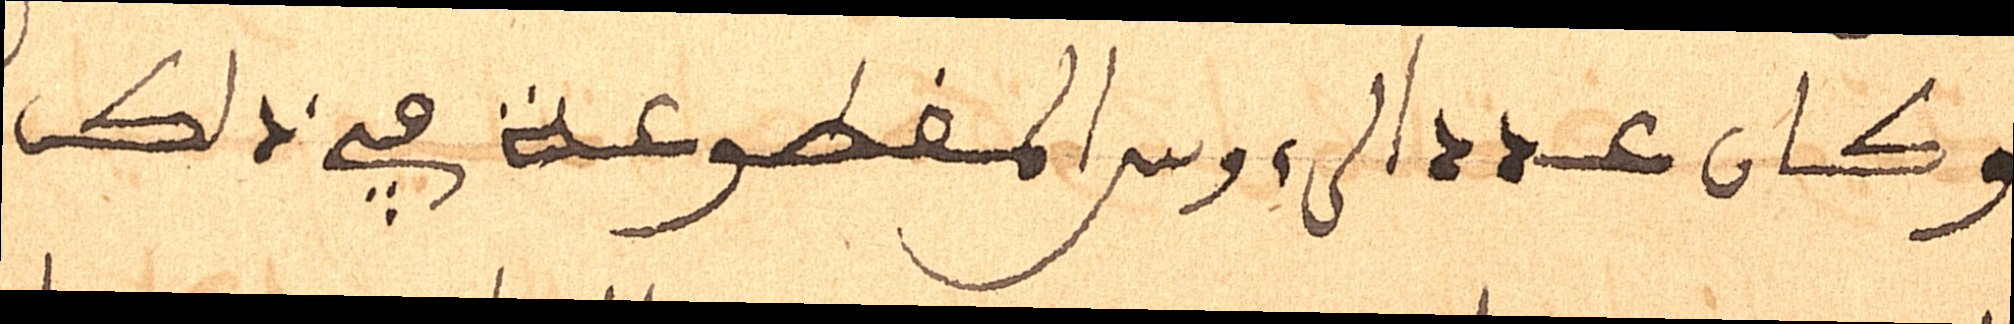وكان عدد الرءوس المقطوعة في ذلك
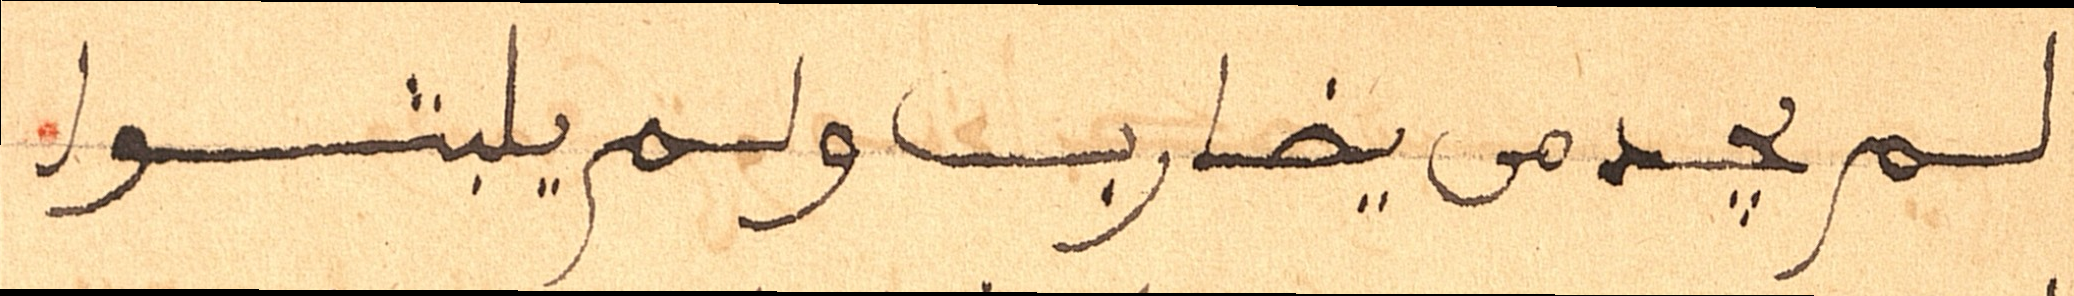لم يجد من يضارب ولم يلبثوا
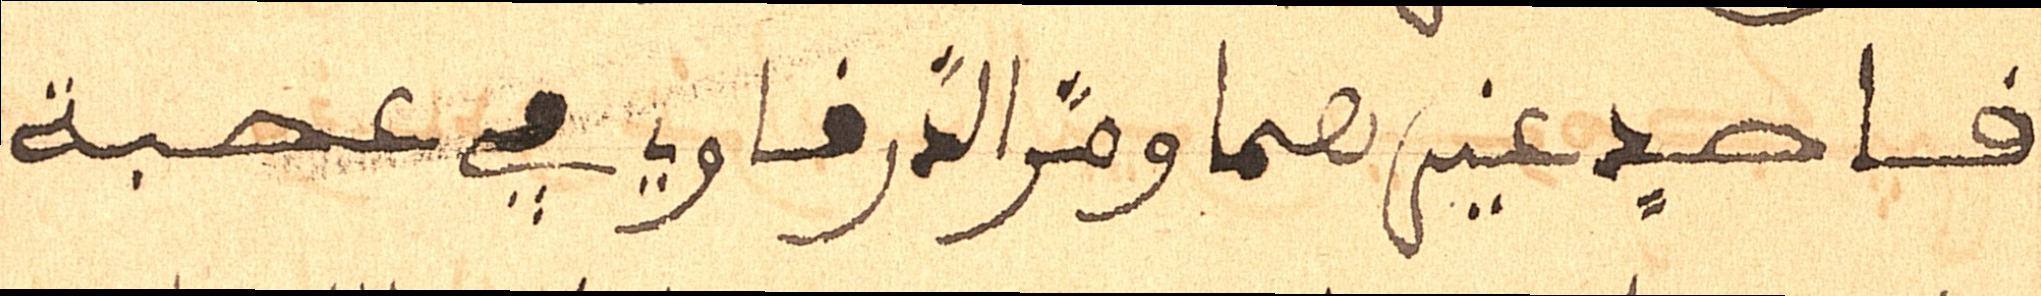قاصد غير هما ومر الدرقاوي في عصبة
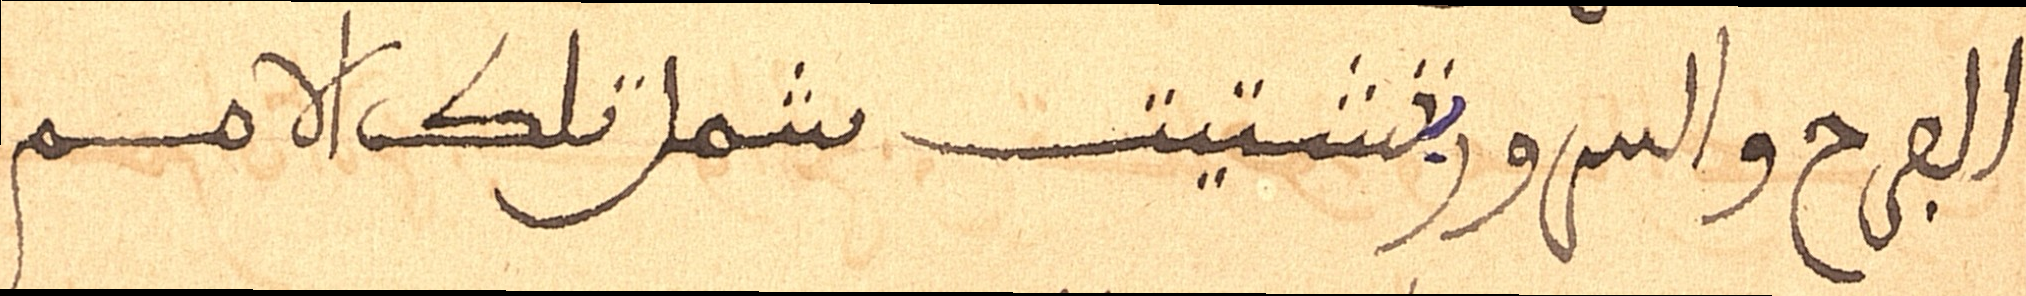الفرح والسرور بتشتيت شمل تلك الامم
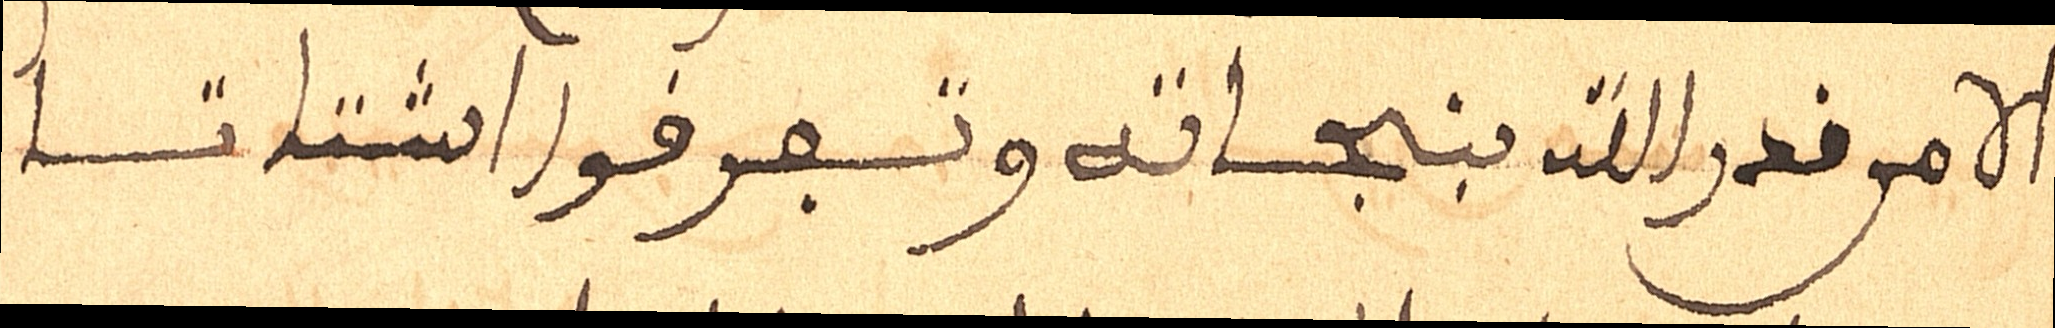الامر قدر الله بنجاته وتفرقوا اشتاتا
